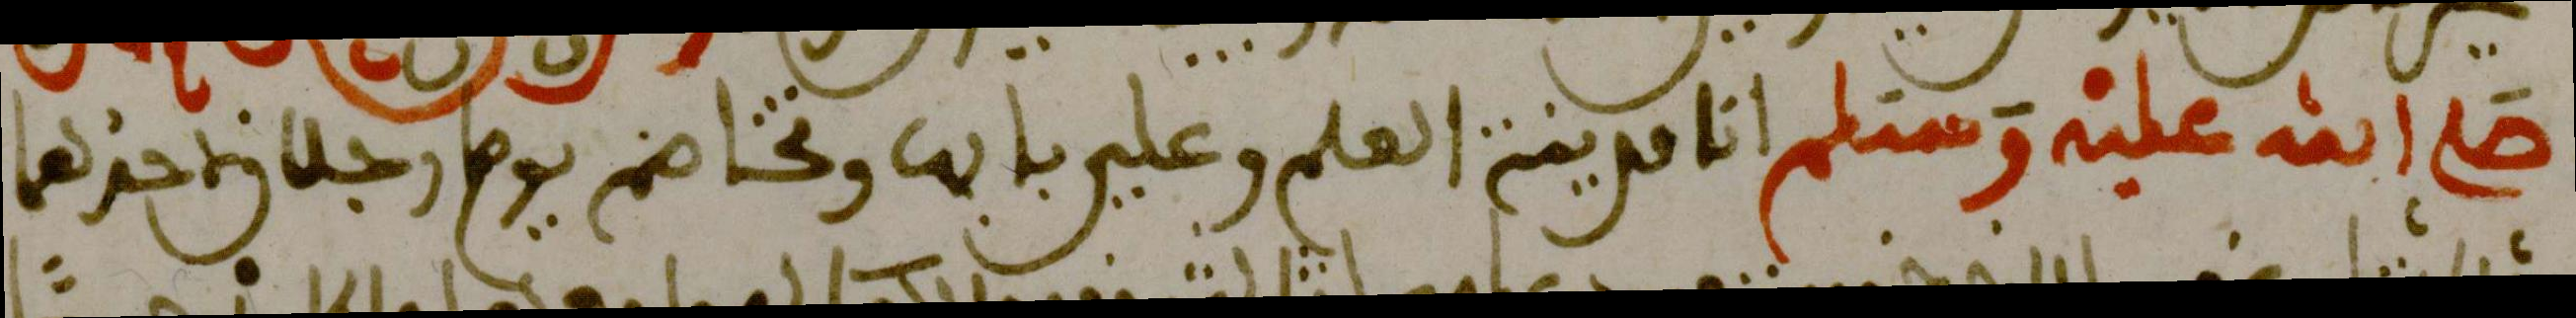صلى الله عليه وسلم انا مدينة العلم وعلي بابها وتخاصم يوم رجلان لاحدهما
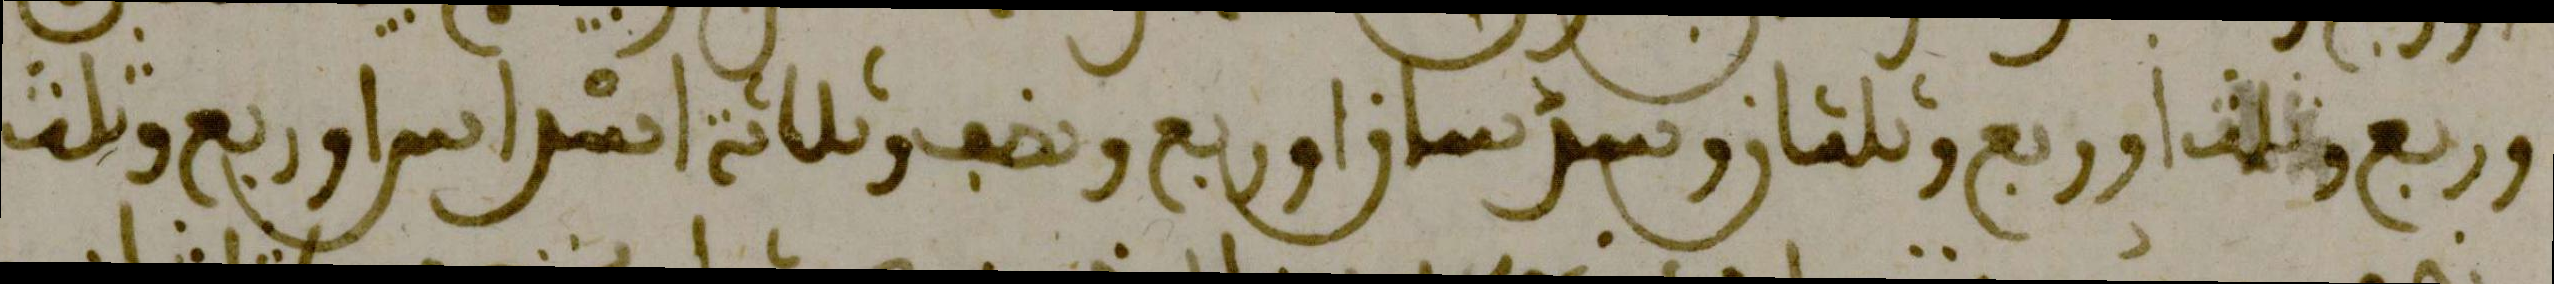وربع وثلث او ربع ثلثان وسدسان او ربع ونصف وثلاثة اسداس او ربع وثلث
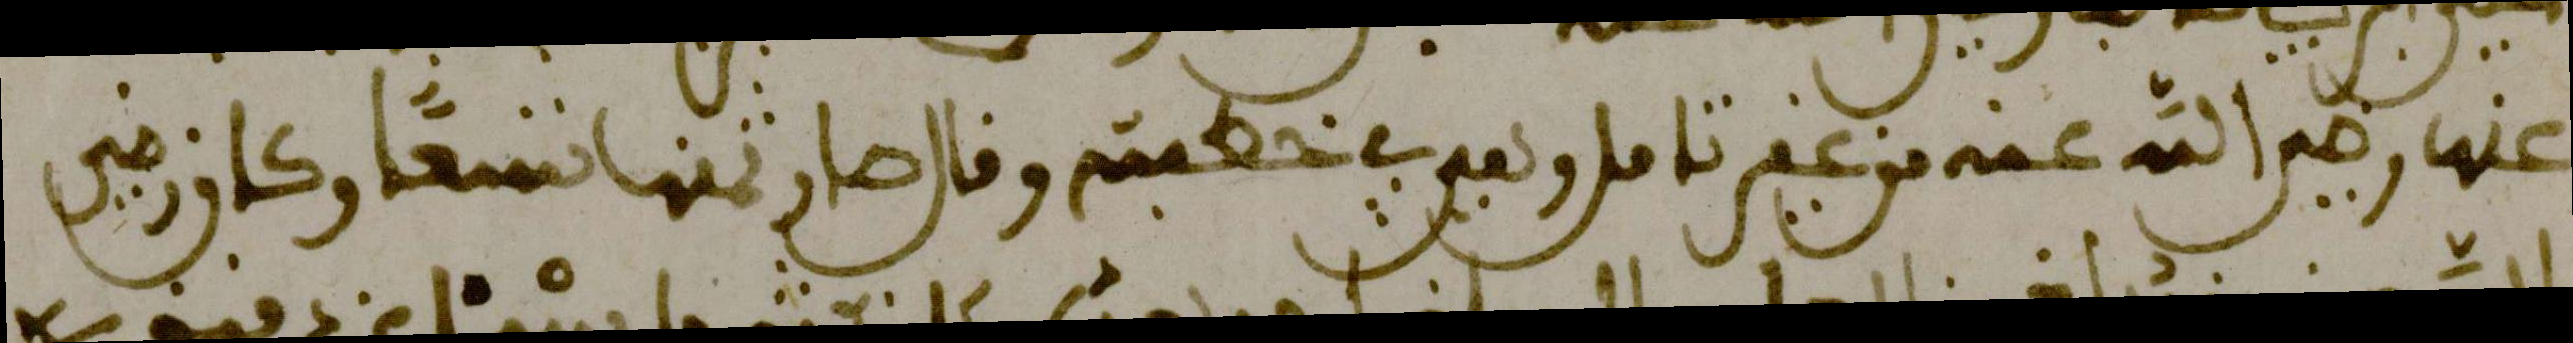عنها رضي الله عنه من غير تامل وهي في خطبه وقال صار ثمنها تسعا وكان رضي
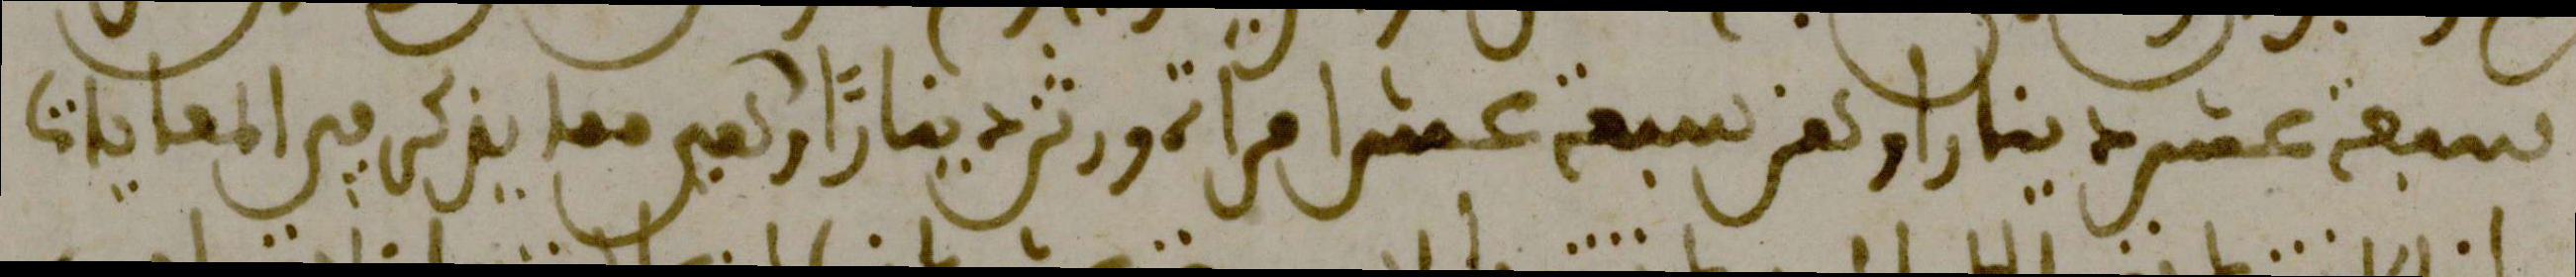سبعة عشر دينار او هن سبعة عشر امراة ورثن دينارا وهي مما يذكر في المعايات
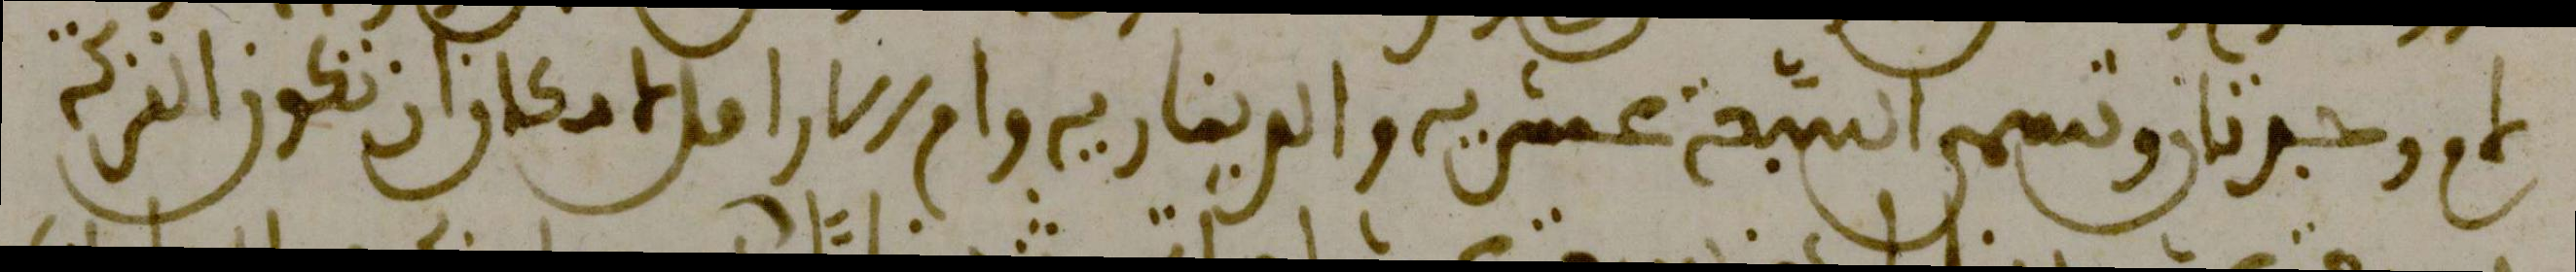لام وجدتان وتسمى السبعة عشريه والديناريه وام الارامل لا مكان ان تكون التركة
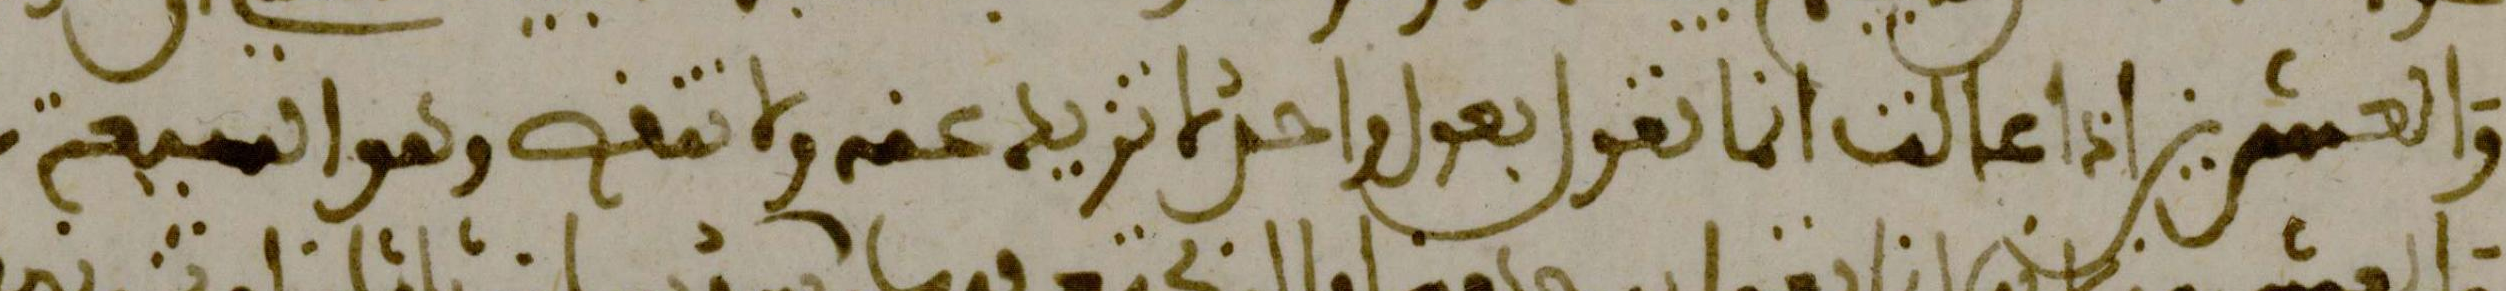والعشرين اذا عالت انما تعول بعول او احد لا تزيد عنه ولا تنقص وهو السبعة
